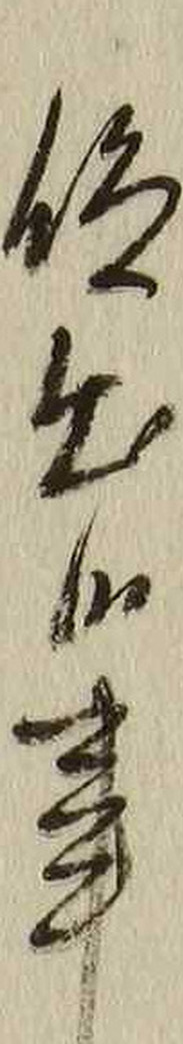仰出候事
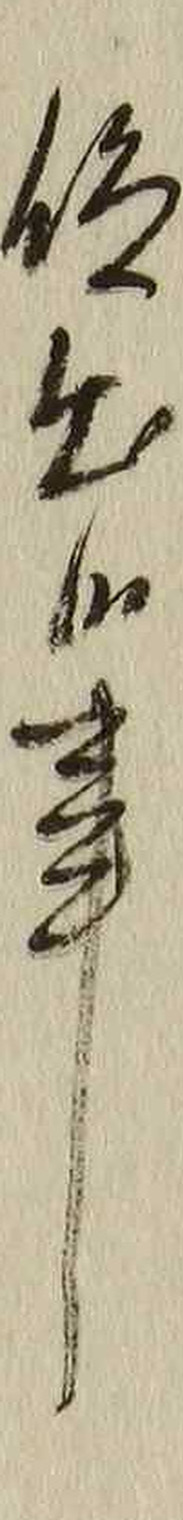仰出候事
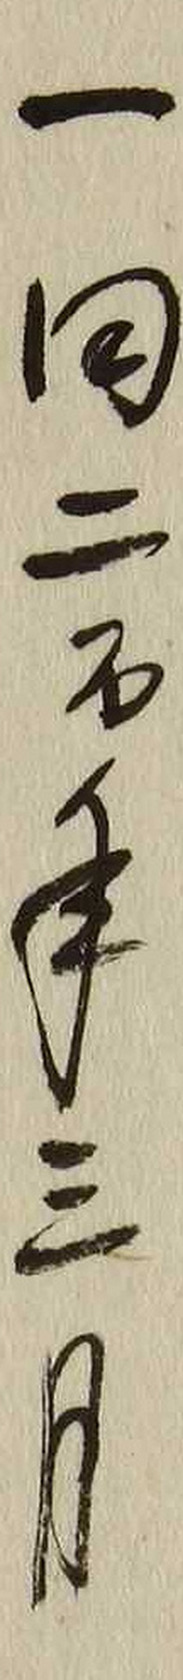一同二酉年三月
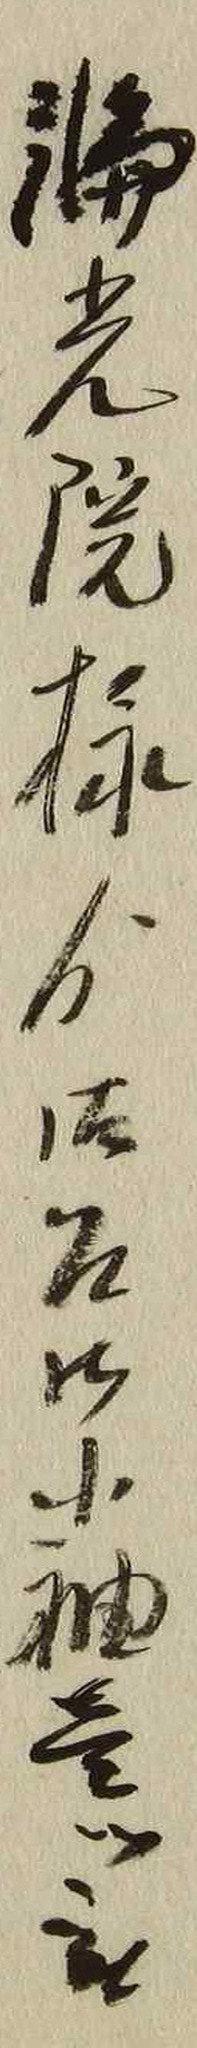輪光院様ゟ御召御小袖壱ツ被
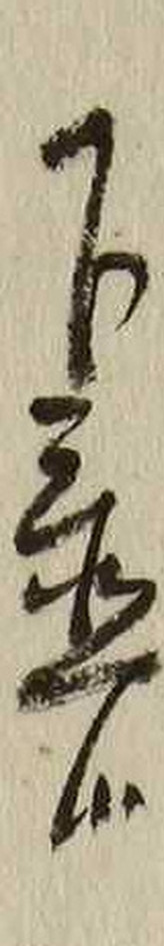下置候
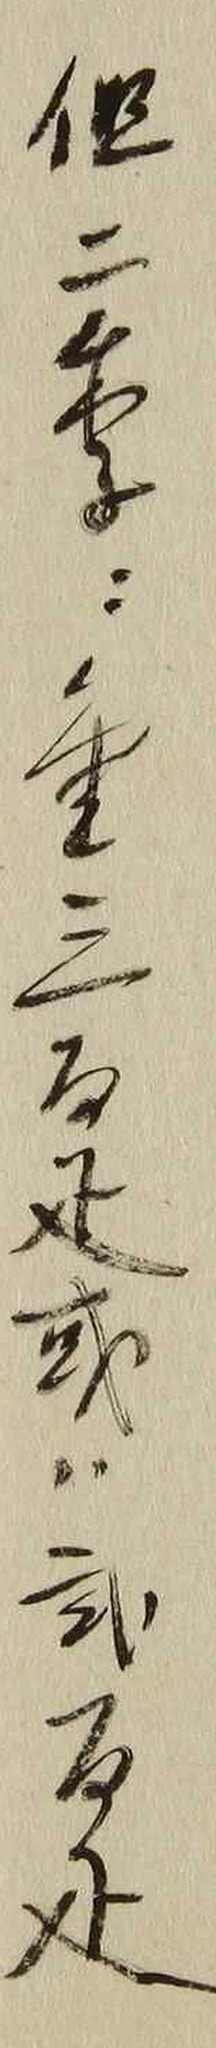但二季ニ金三百疋或ハ弐百疋
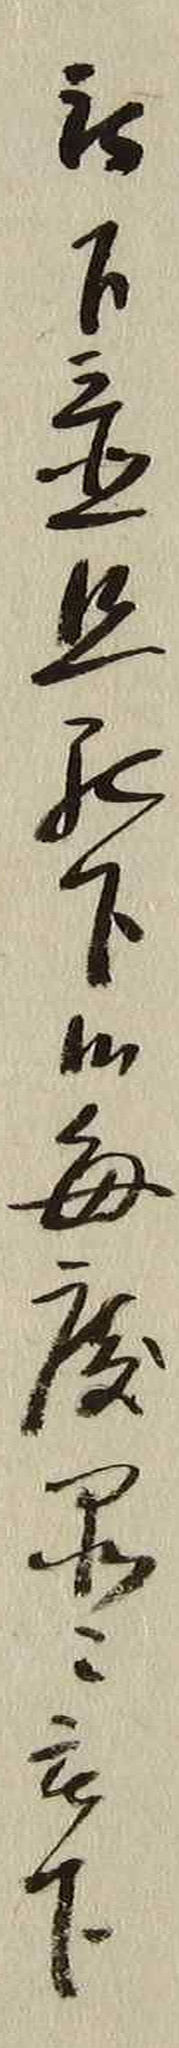被下置且罷下候毎度品々被下
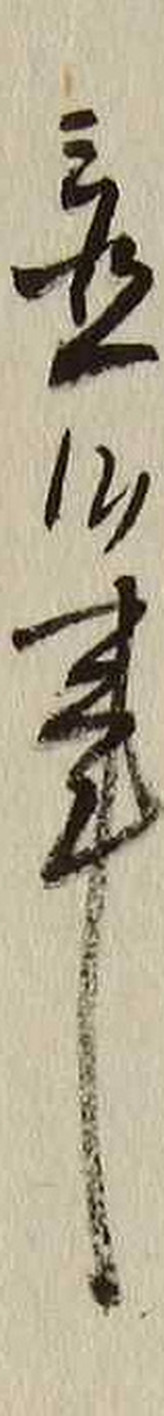置候事
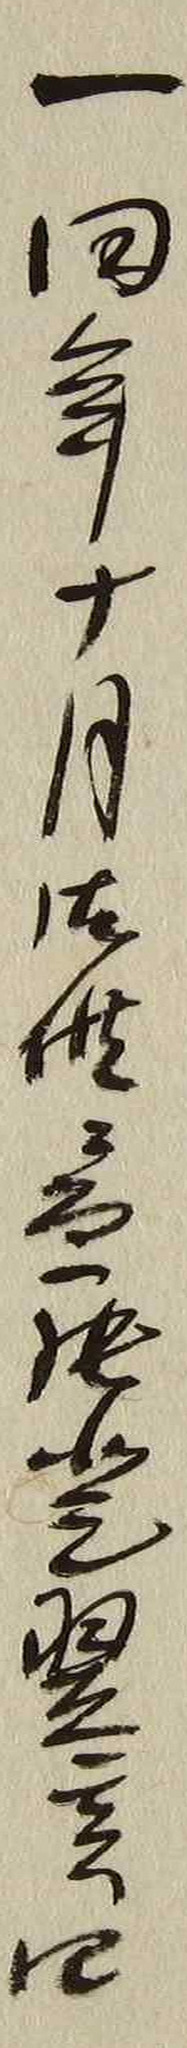一同年十月御供ニ而罷登翌亥四
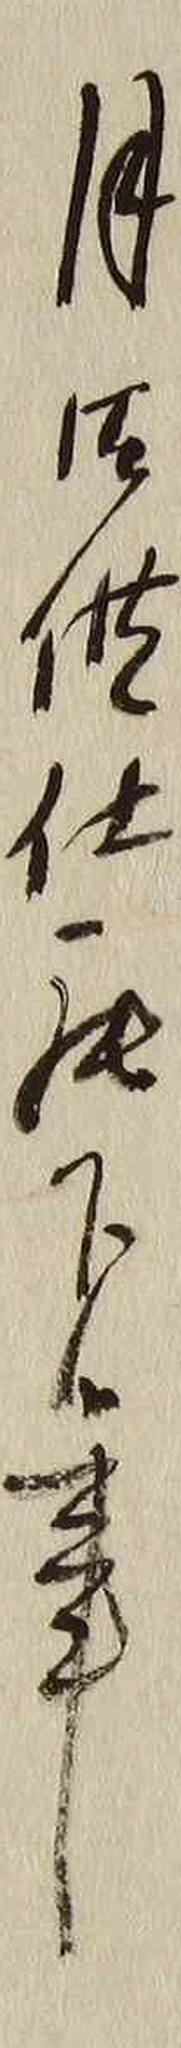月御供仕罷下候事
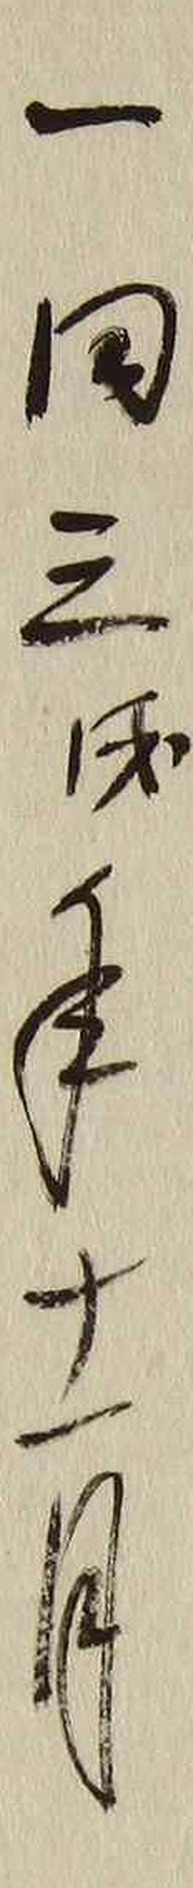一同三戌年十一月
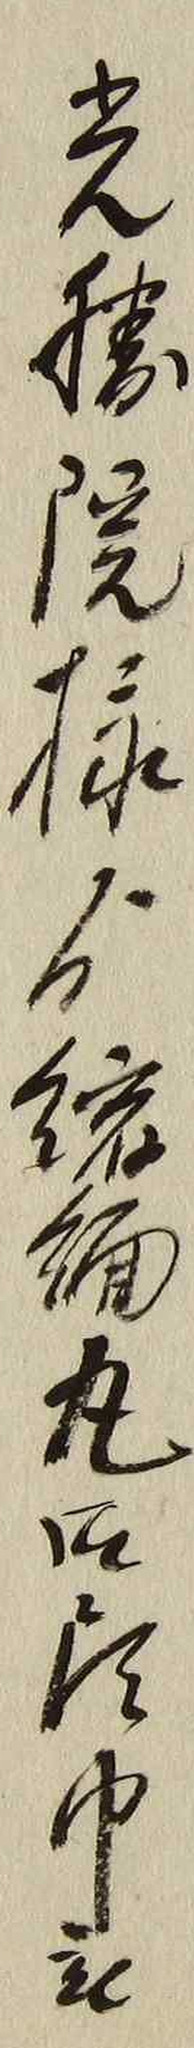光勝院様ゟ縮緬丸御頭巾被
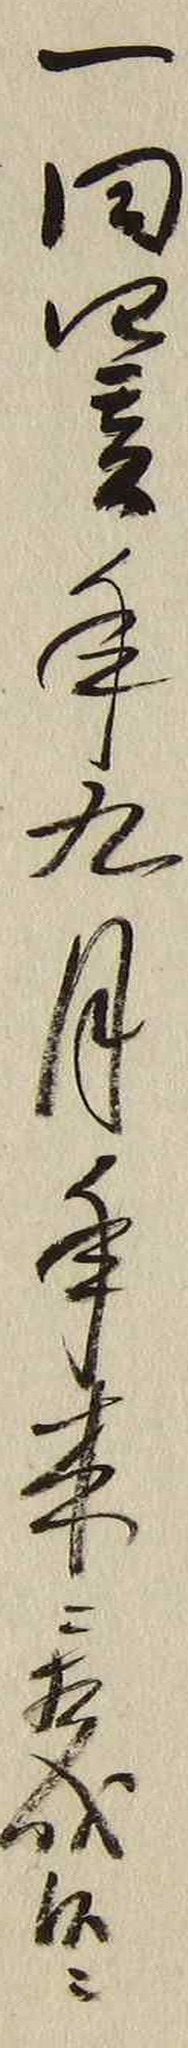一同四亥年九月年来ニ相成候ニ
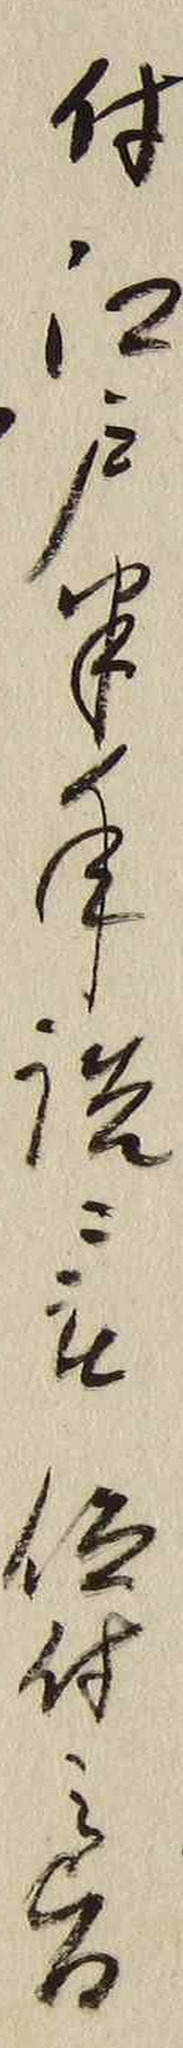付江戸半年詰ニ被仰付之旨
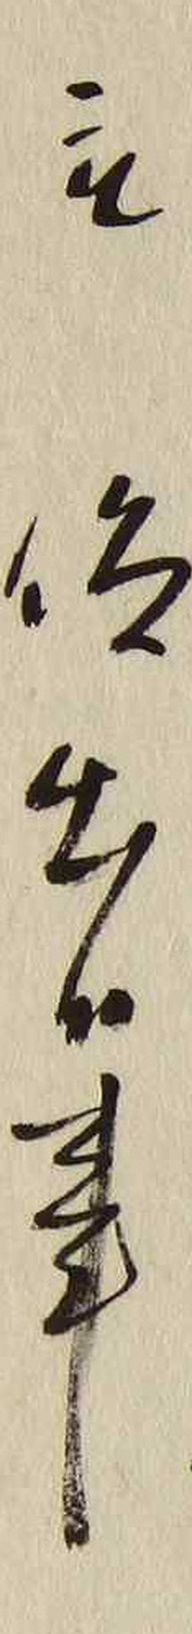被仰出候事
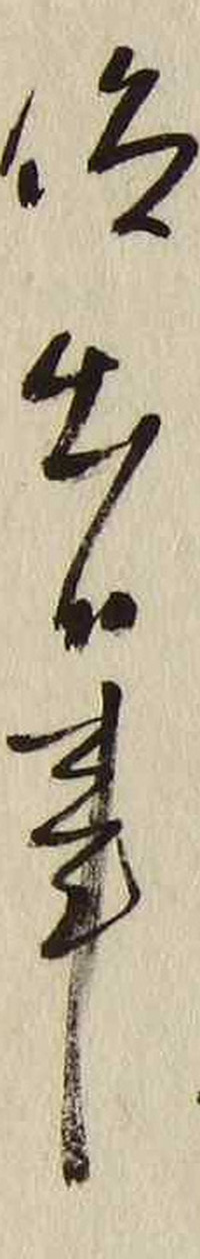仰出候事
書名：諸士系譜　巻之353　す之部3
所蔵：会津若松市立会津図書館
